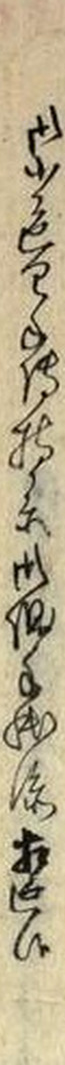御小道具手伝持参御側手紙添相廻候
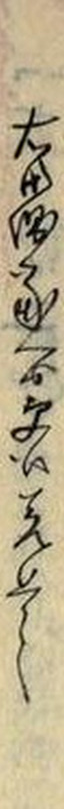右御側御用人ゟ受取差上之

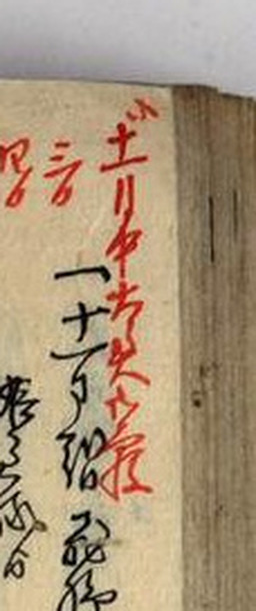十一月中大奥御寝
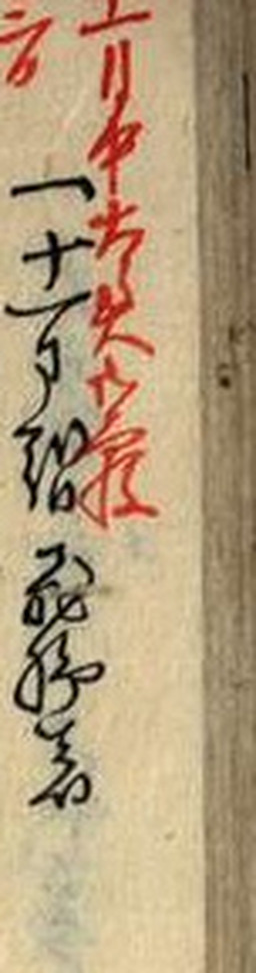一十一月朔日飛脚着
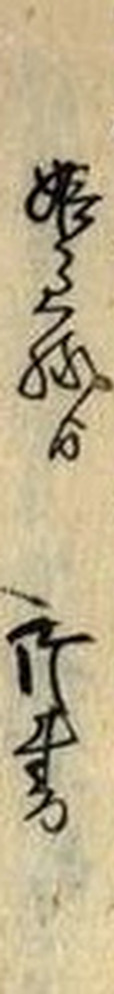姫君様ゟ御書
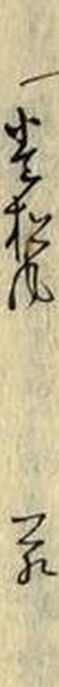巻松風一箱
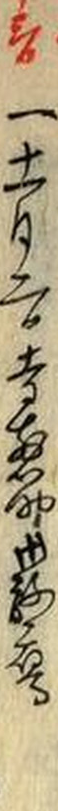一十一月二日寺前筋御放鷹
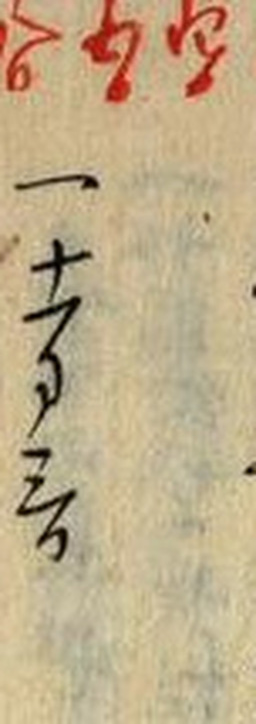一十一月三日
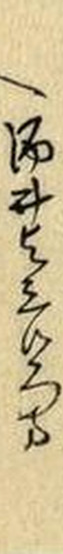酒井与三左衛門方
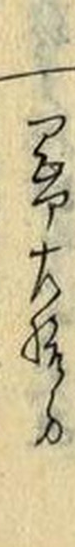岡部左膳方
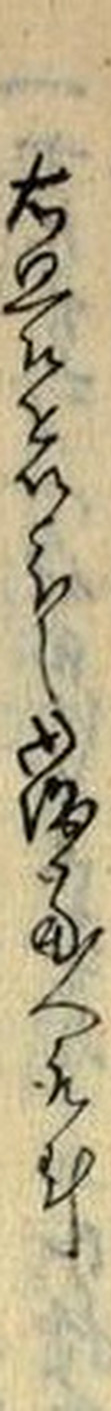右思召を以被下之御側御用人取斗
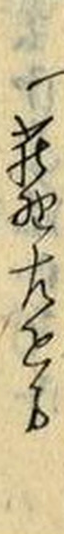荻野左近方
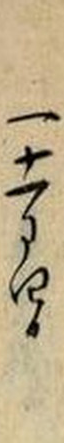一十一月四日
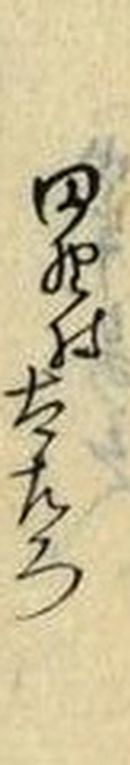田野村太郎左衛門
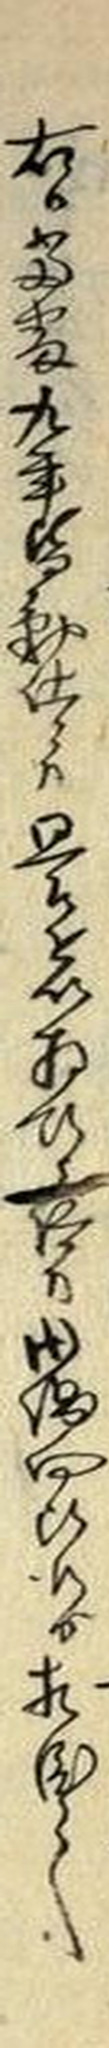右ハ当番九年皆勤仕候ニ付思召を以拝領被仰付御側向頭取ゟ相渡之
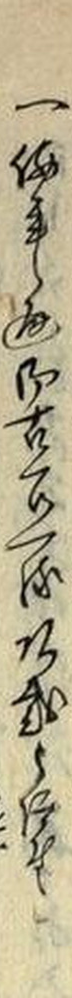一例年之通御古召一統頂戴被仰付候
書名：少傅日録抄（斉承付側向頭取日記、在国）
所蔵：福井県文書館 Fukui Prefectural Archives
